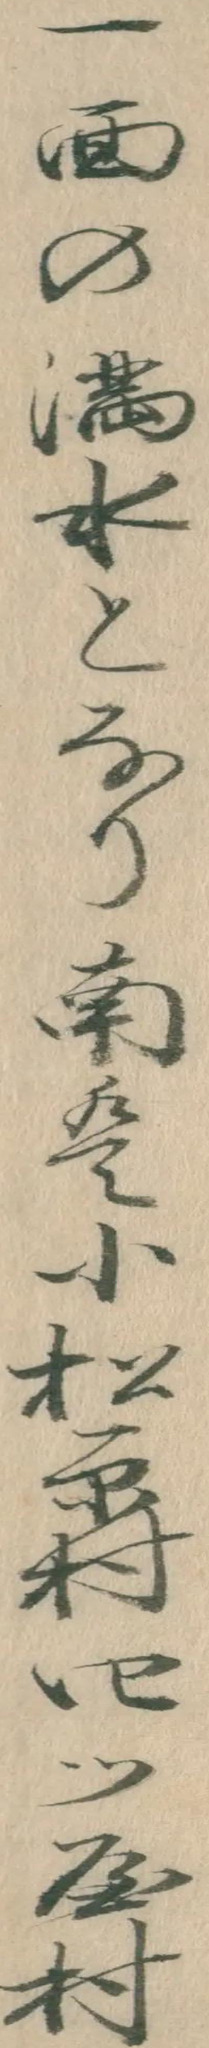一面の満水となり南は小松原村四ツ屋村

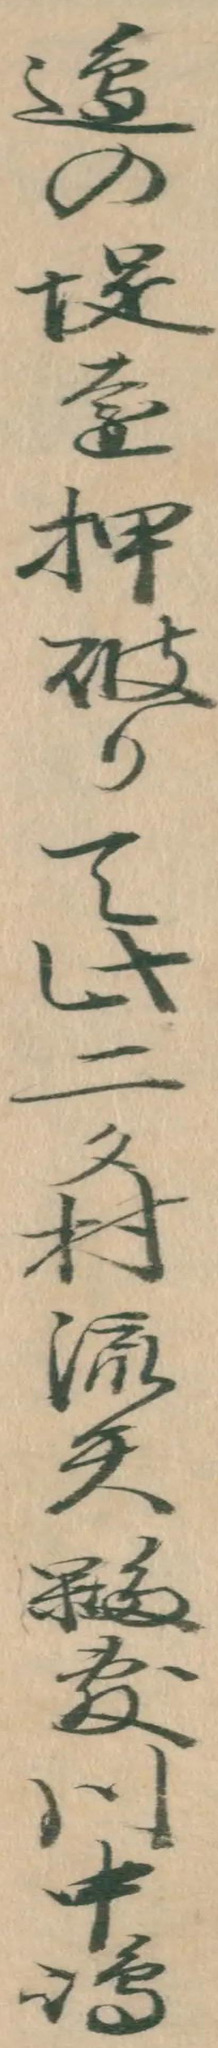辺の堤を押破りて此二タ村流失夥敷川中嶋
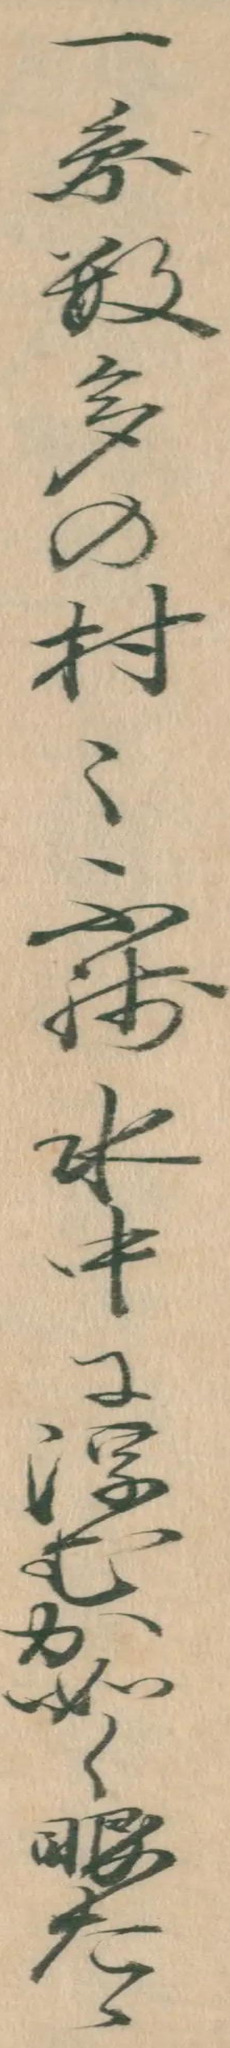一円数多の村々不残水中に浮むか如く眼たゝ
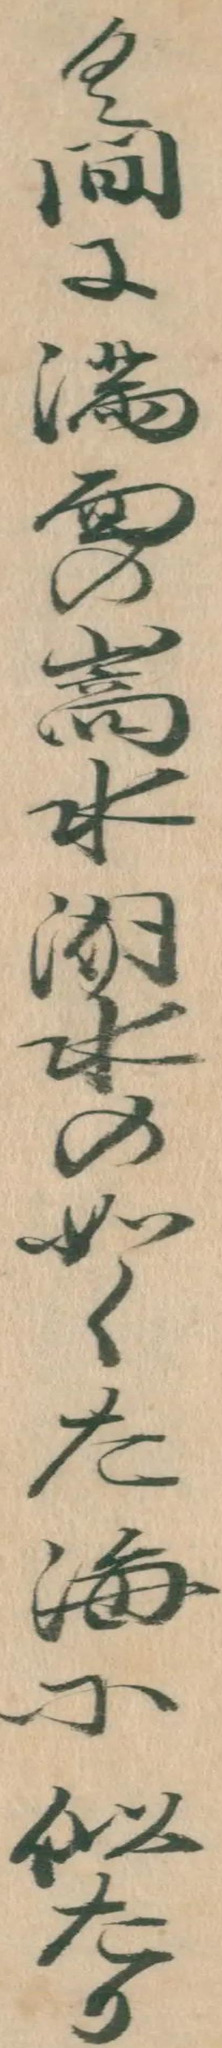く間に満面の嵩水湖水の如く太海に似たり
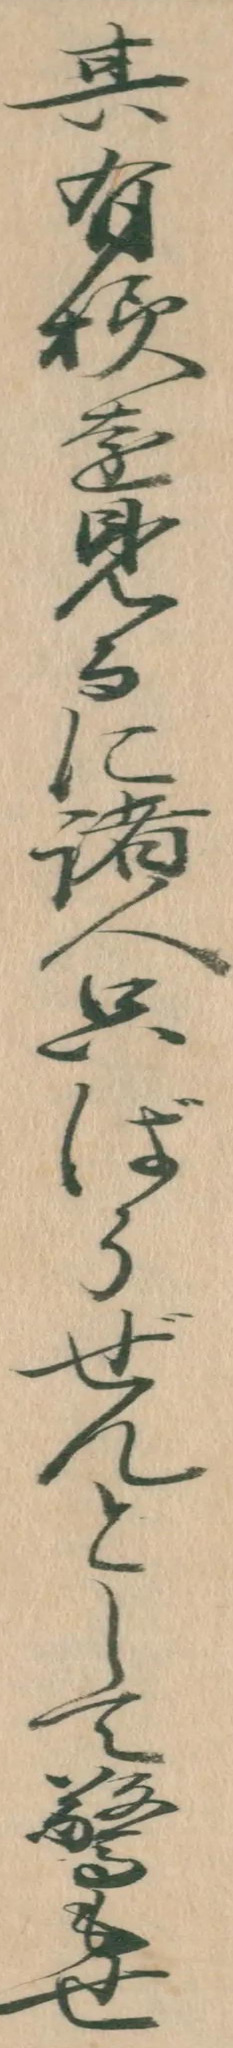其有様を見るに諸人只ばうぜんとして驚もせ
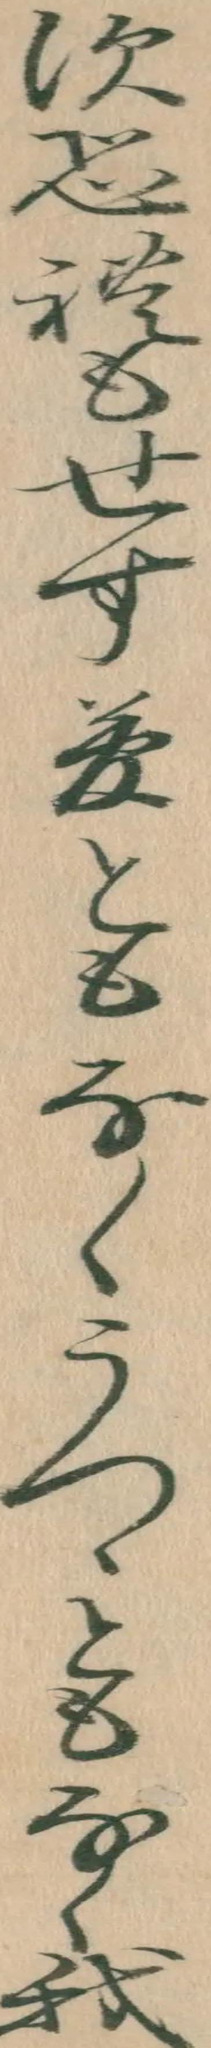す恐れもせす夢ともなくうつゝともなく我
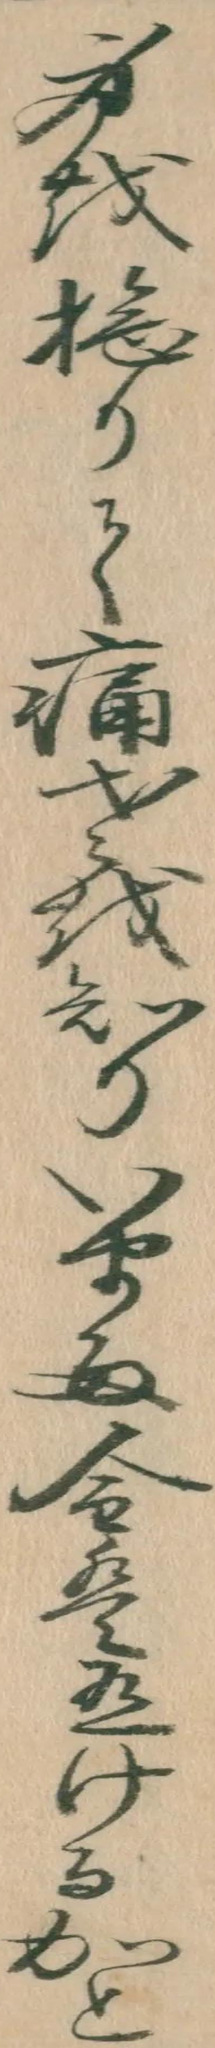身を捻りて痛さを知りいまた合は有けるかと
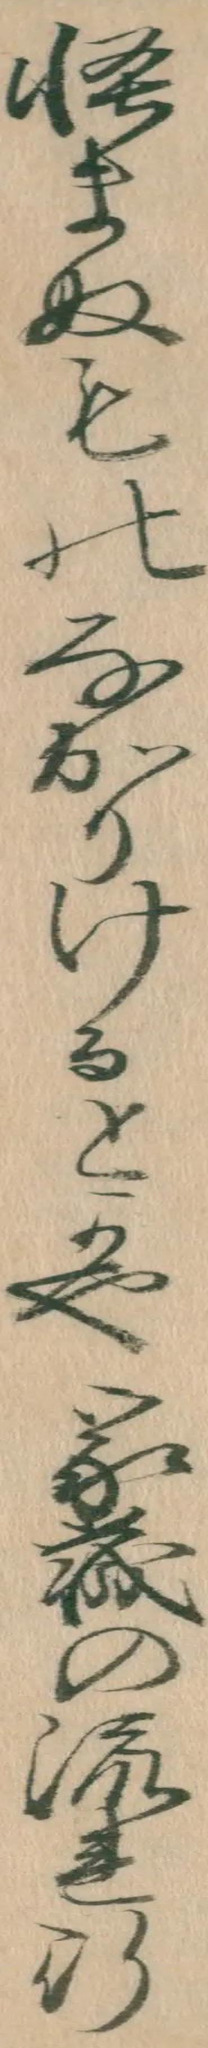怪まぬものなかりけるとかや家蔵の流れ行
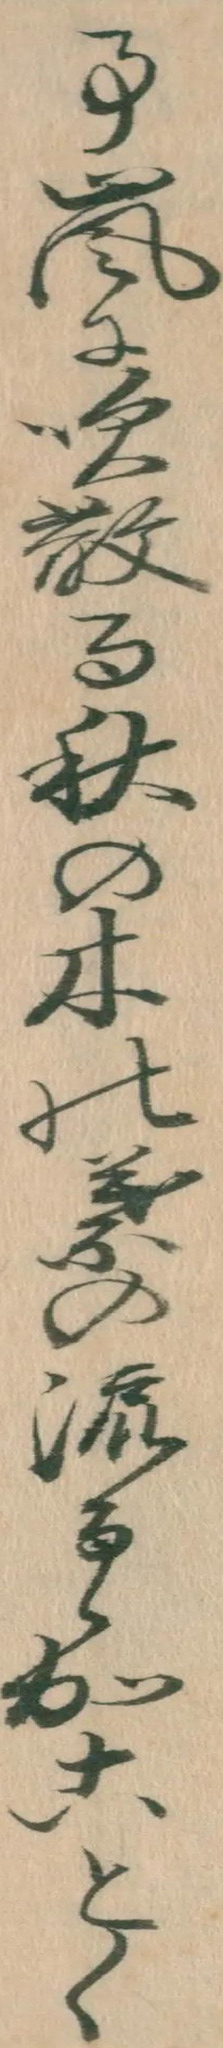事嵐に吹散る秋の木の葉の流るゝかことく
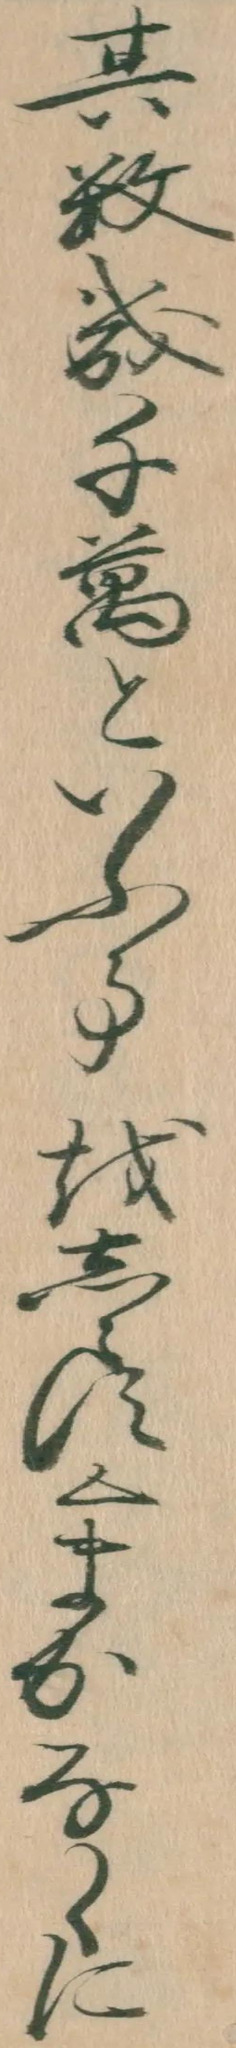其数幾千万といふ事をしらす△まかなくに
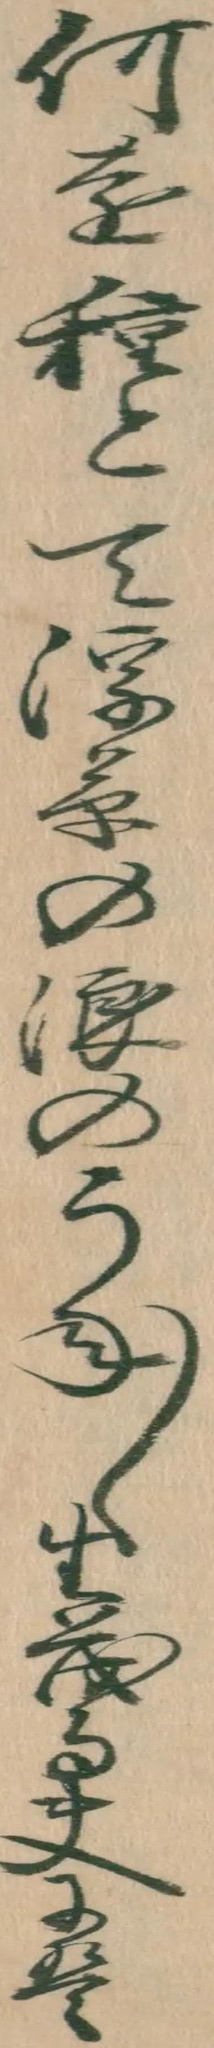何を種とて浮草の浪のうね〳〵生茂る夫には
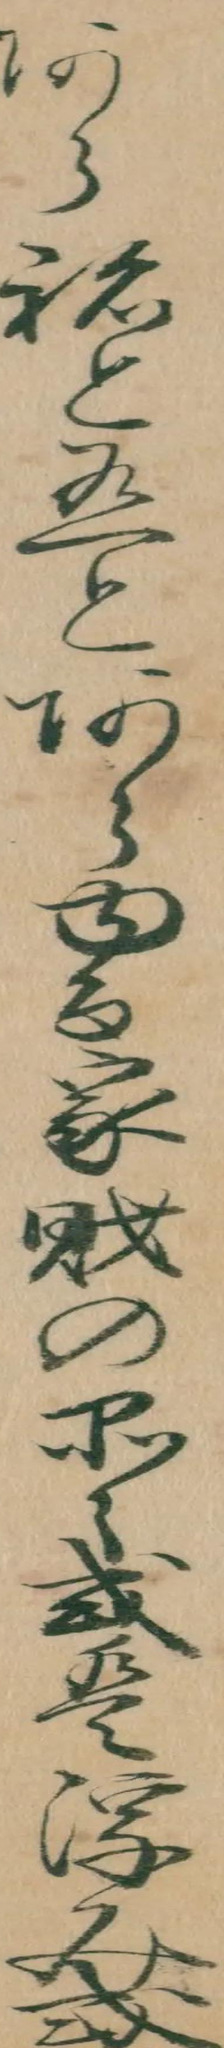あらねと有とあらゆる家財の品々或は浮み或
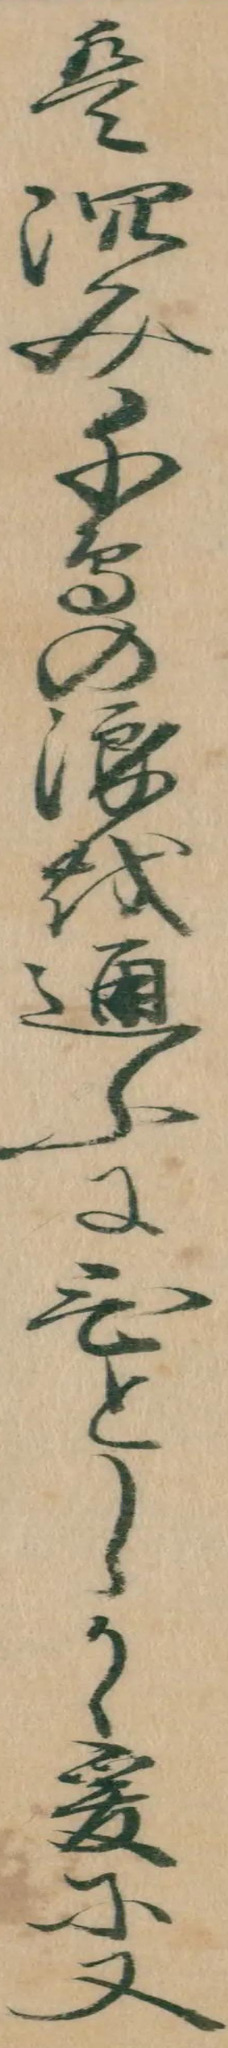は沈み千鳥の浪を通ふにひとしかりし爰に又
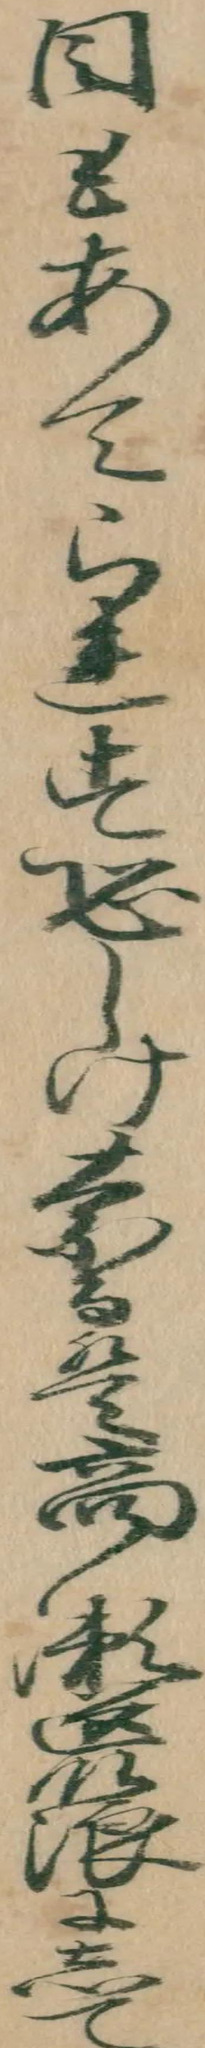目もあてられす恐しけなるは高瀬荒浪にして
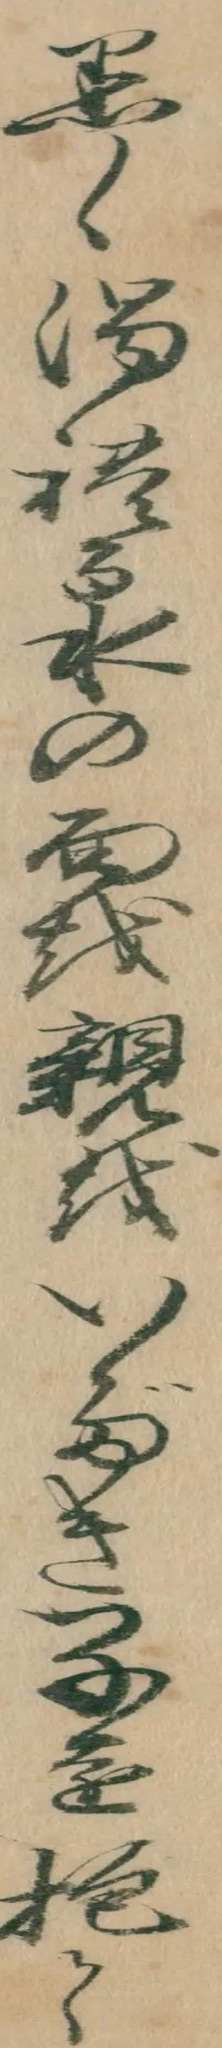黒く濁れる水の面を親をいだき子を抱て
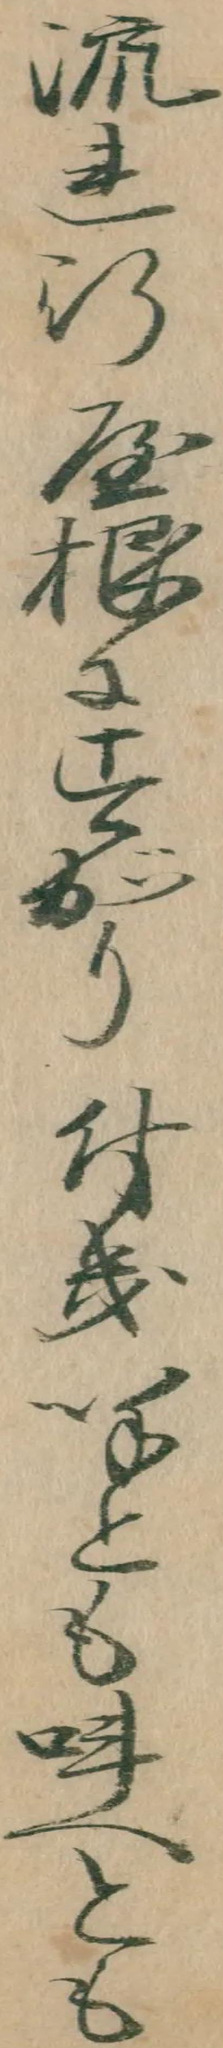流れ行屋根にすがり付き呼とも叫へとも
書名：俗語之種. [7]
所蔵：国立国会図書館 National Diet Library, JAPAN
